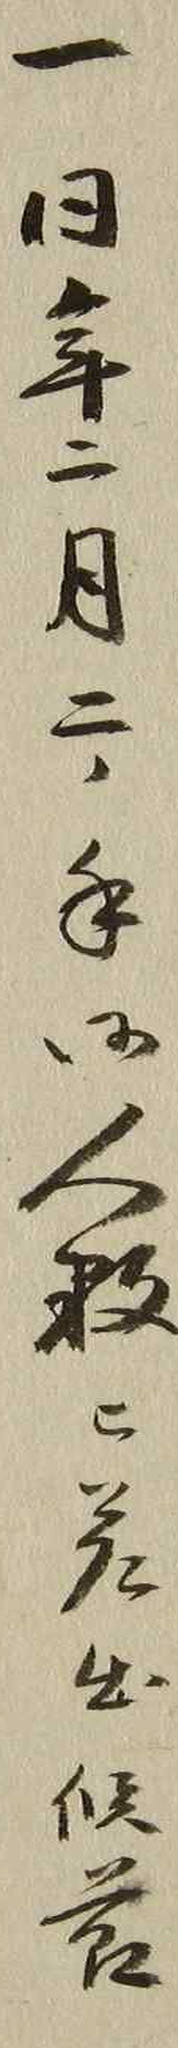一同年二月二ノ手御人数被差出候節
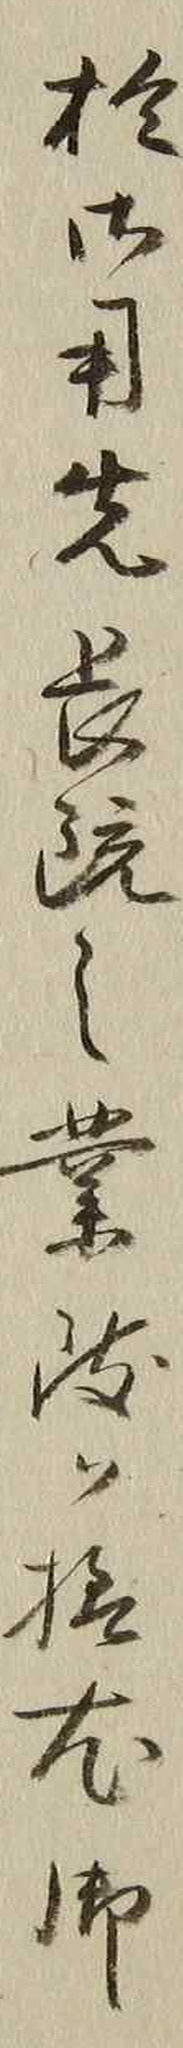於御用先長銃之業致候様尤御
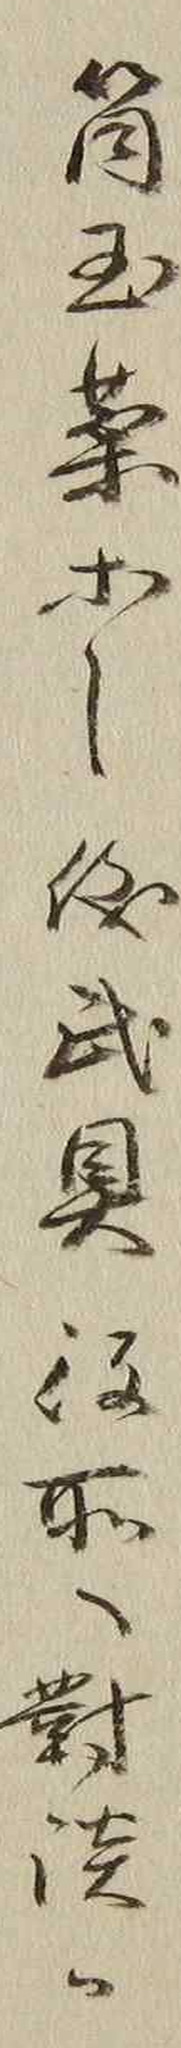筒玉薬等之儀武具役所へ対談候
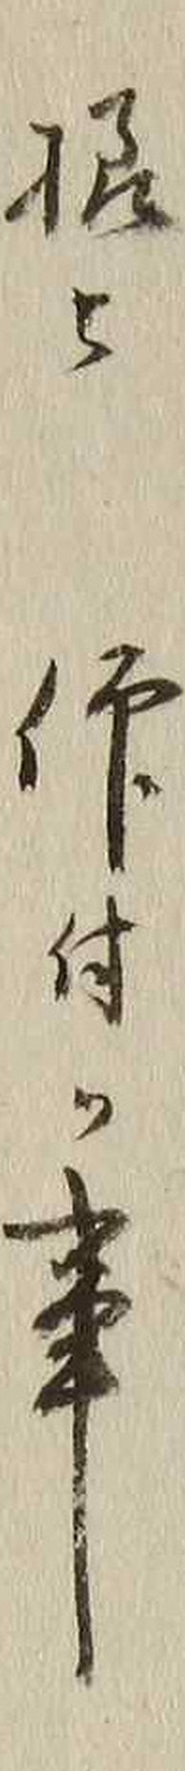様被仰付候事
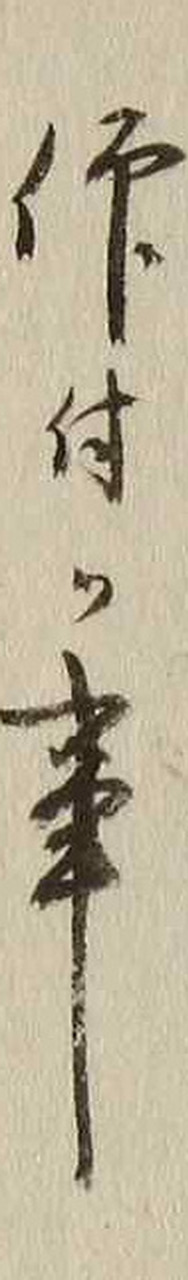仰付候事
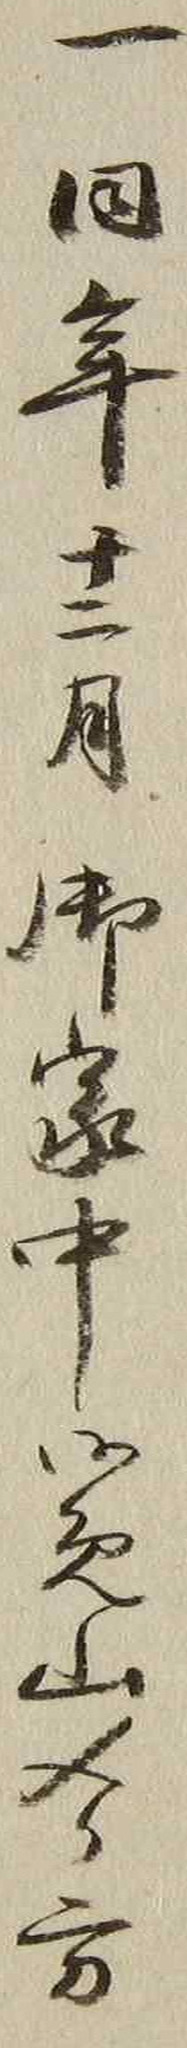一同年十二月御家中御免山〆り方
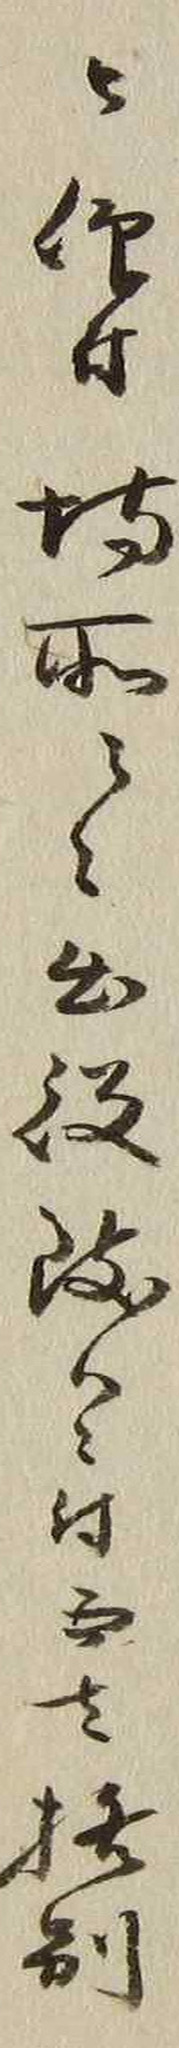被仰付場所々々出役致候ニ付而者格別
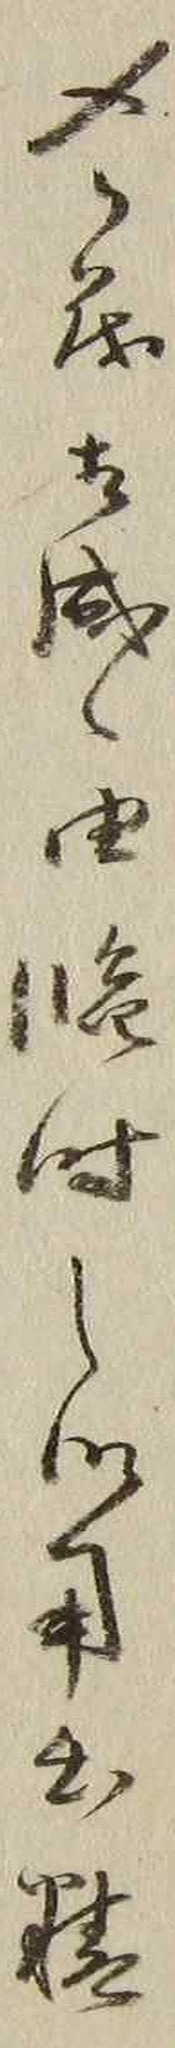〆り茂相成候由臨時之御用出精
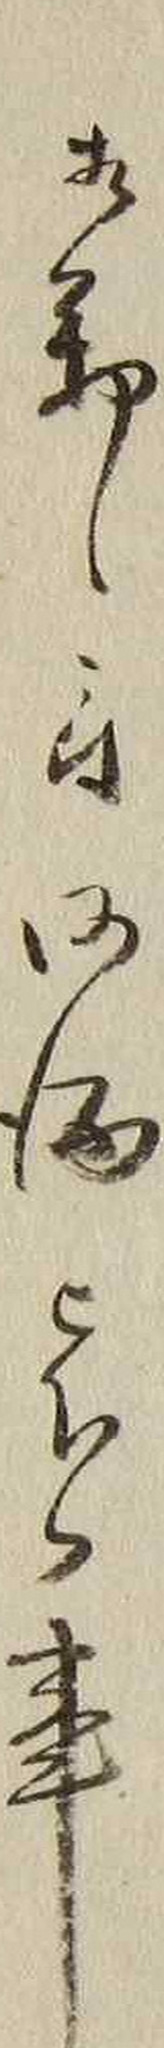相勤候ニ付御酒被下候事
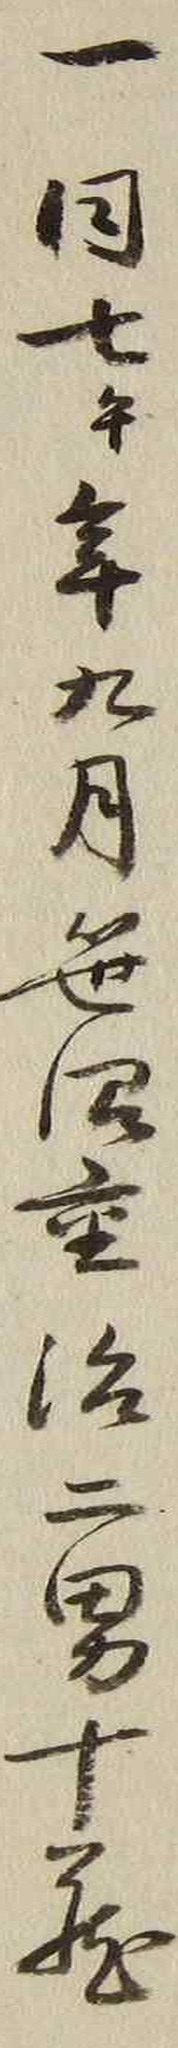一同七午年九月笹沼重治二男十蔵
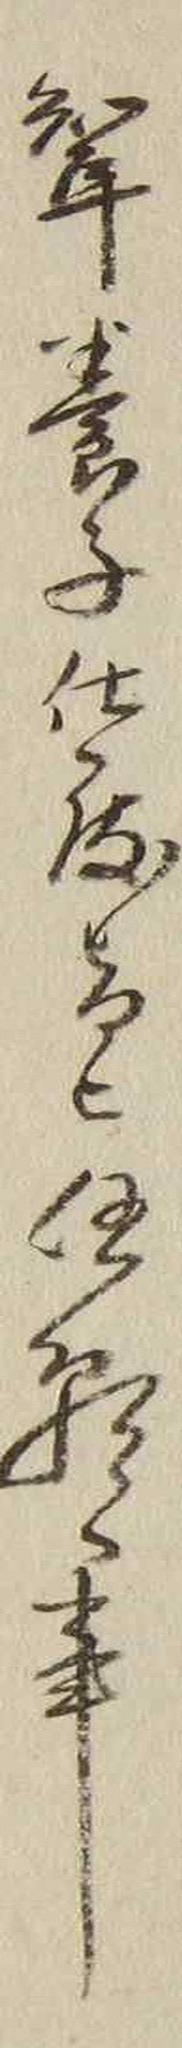婿養子仕度旨被任願候事
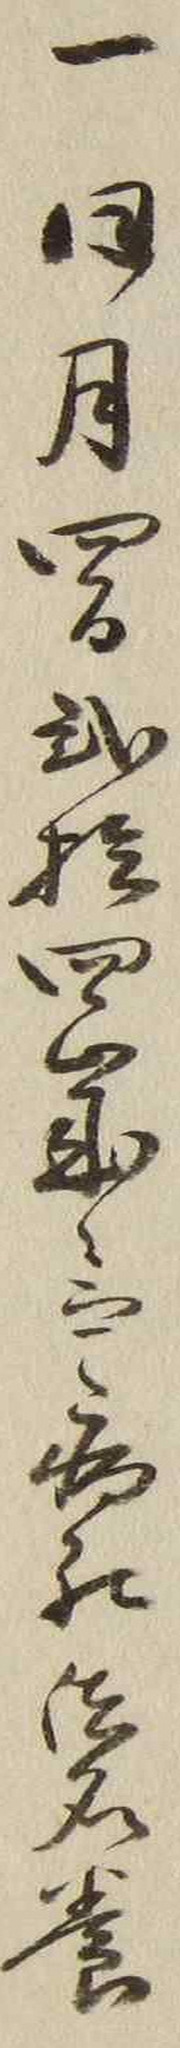一同月四日弐拾四歳ニ而病死法名養

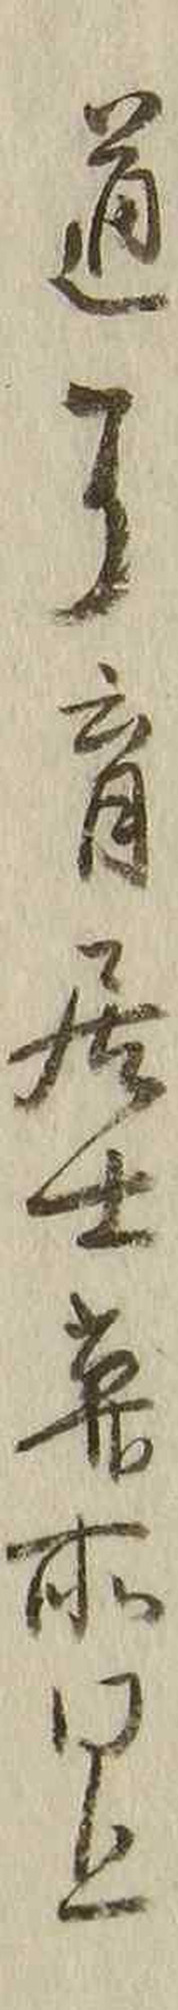道了育居士葬所同上
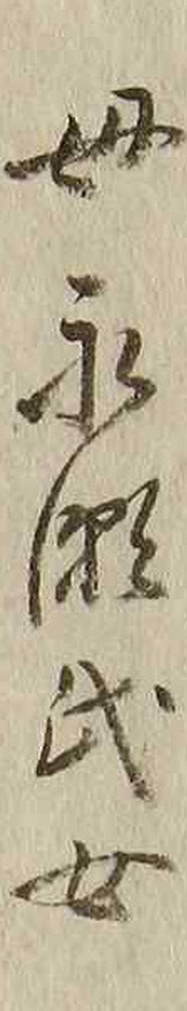母永瀬氏女
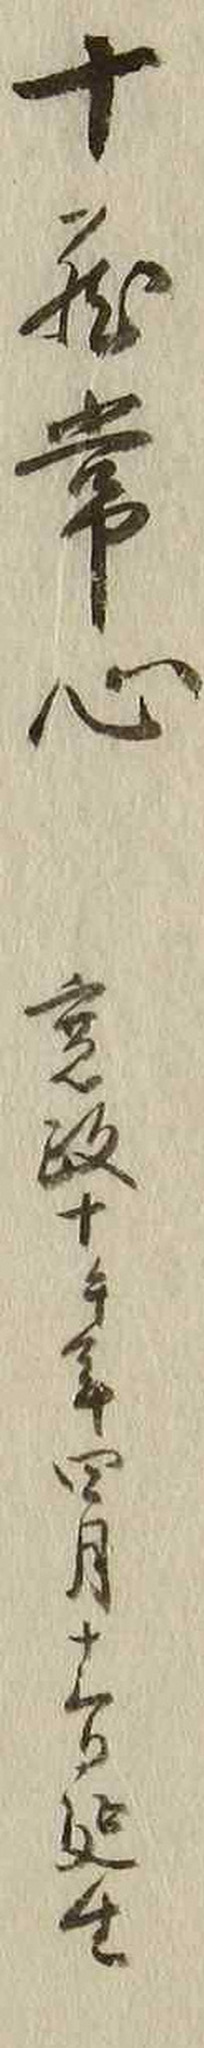十蔵常心寛政十午年四月十三日誕生
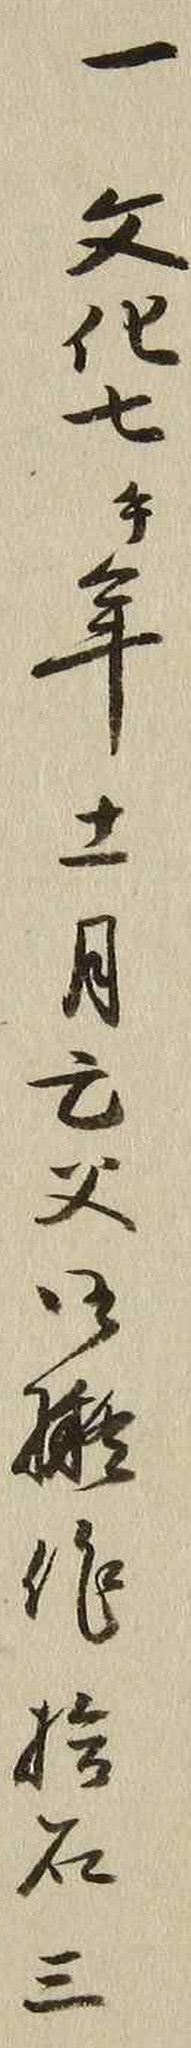一文化七午年十一月亡父御擬作拾石三
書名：諸士系譜　巻之236　ふ之部4
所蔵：会津若松市立会津図書館
